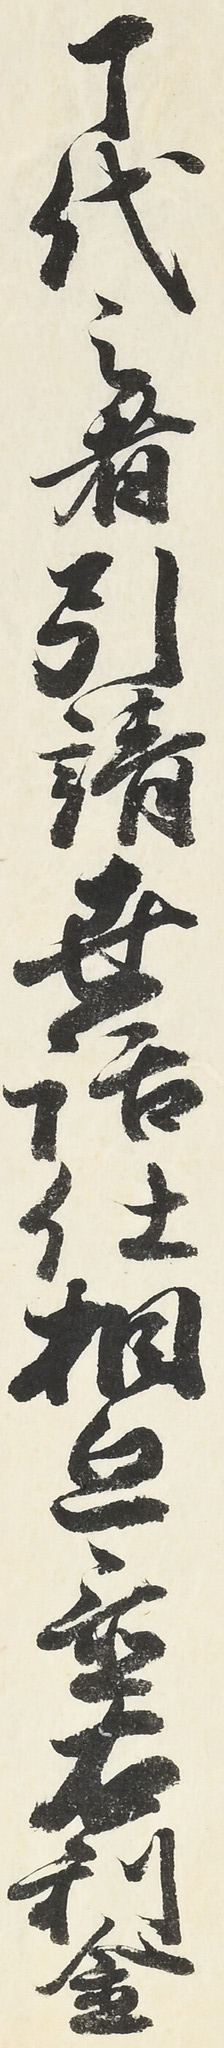丁代之者引請世話仕相廻置右利金
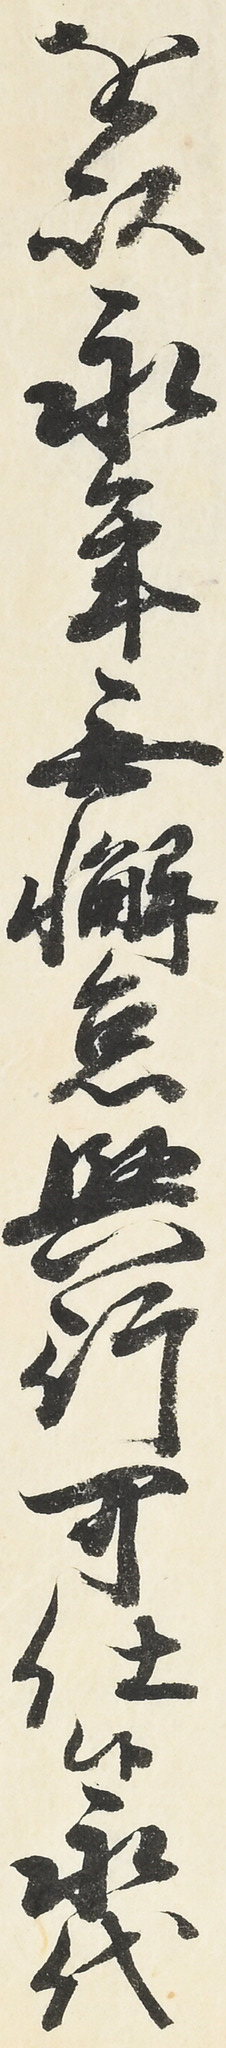を以永年無懈怠興行可仕候永代
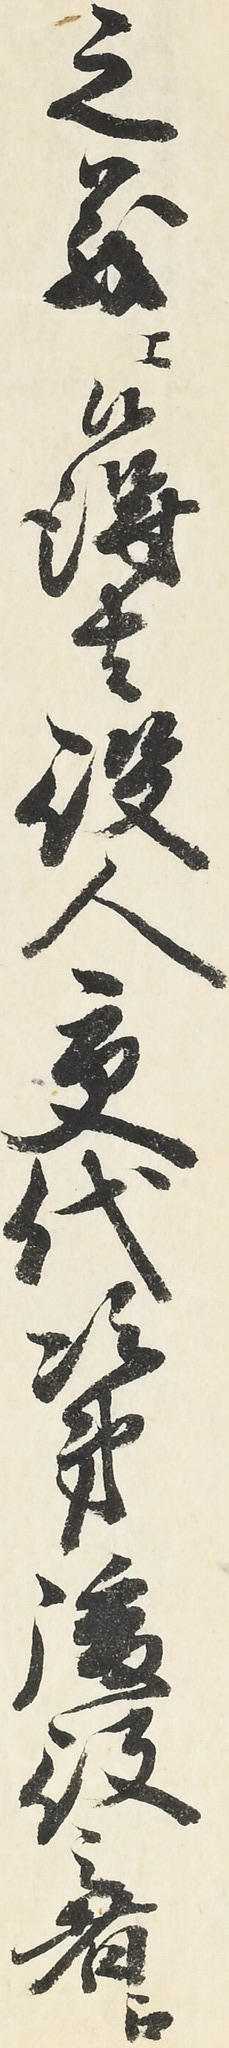之儀ニ候得は役人交代次第後役之者江
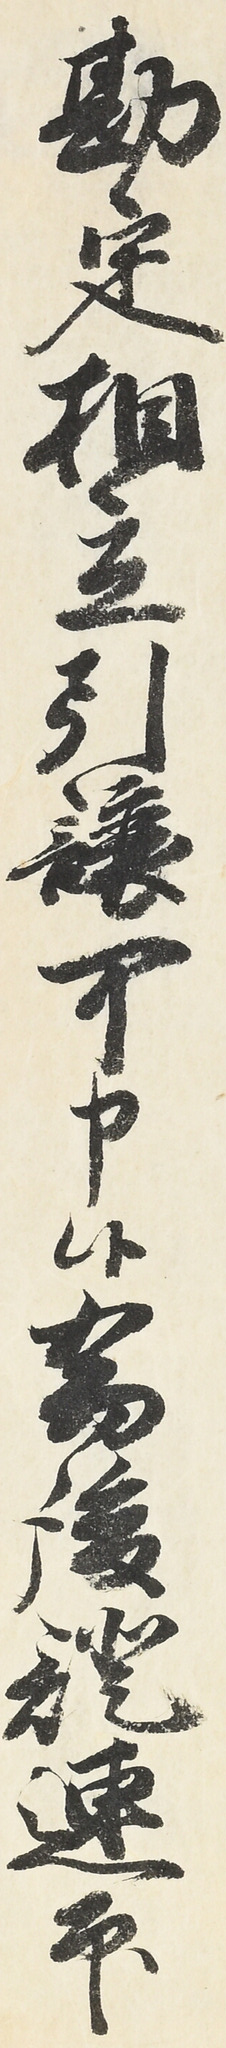勘定相立引譲可申候為後証連印

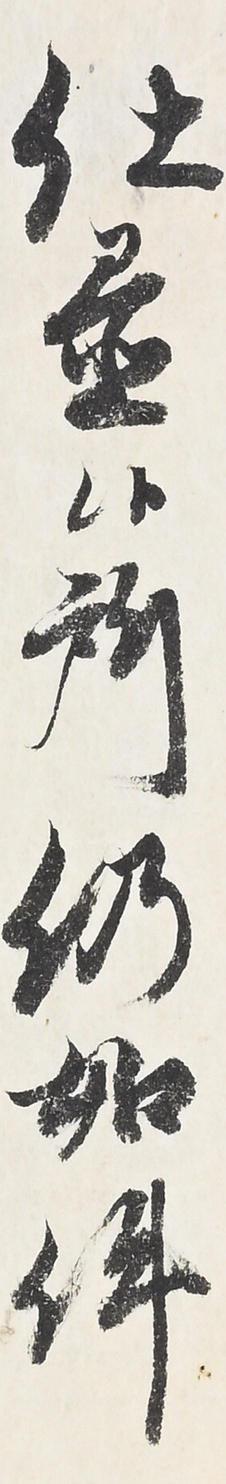仕置候所仍如件
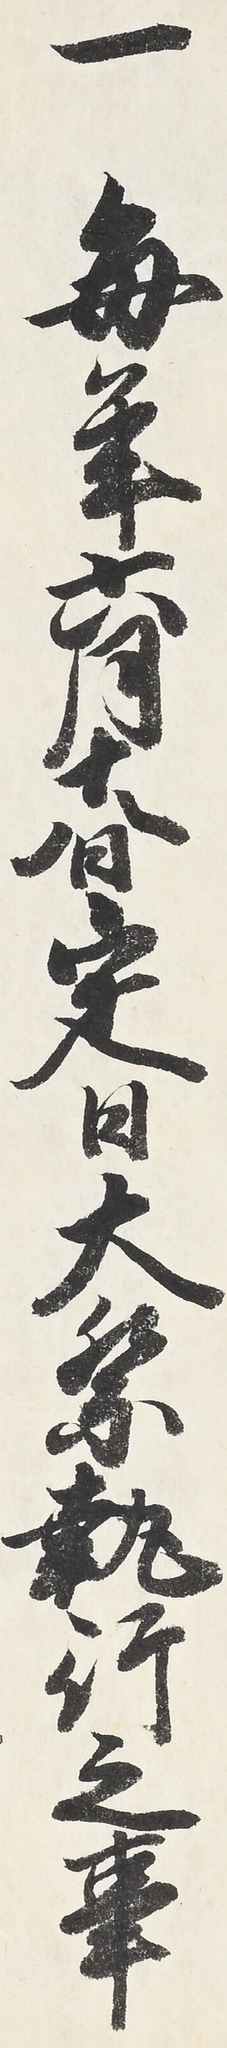一毎年六月十八日定日大祭執行之事
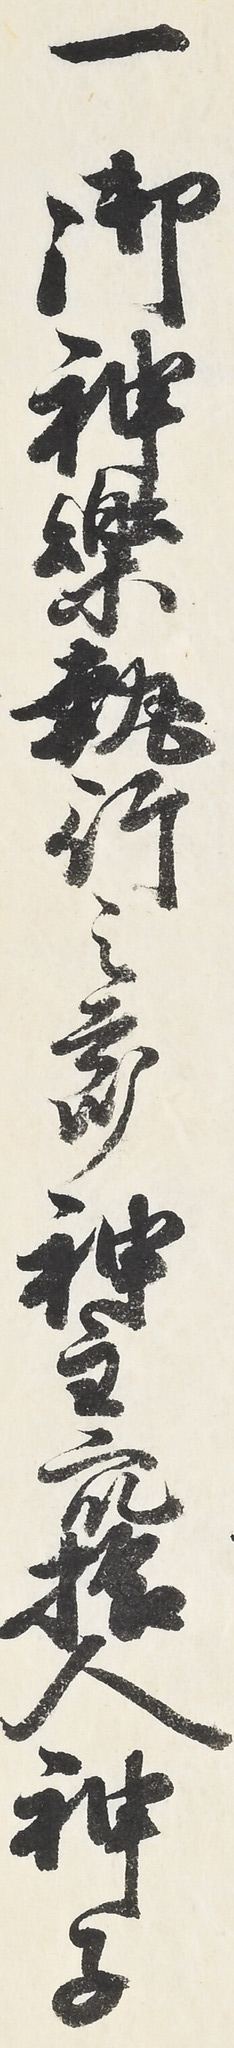一御神楽執行之節神主衆拾人神子
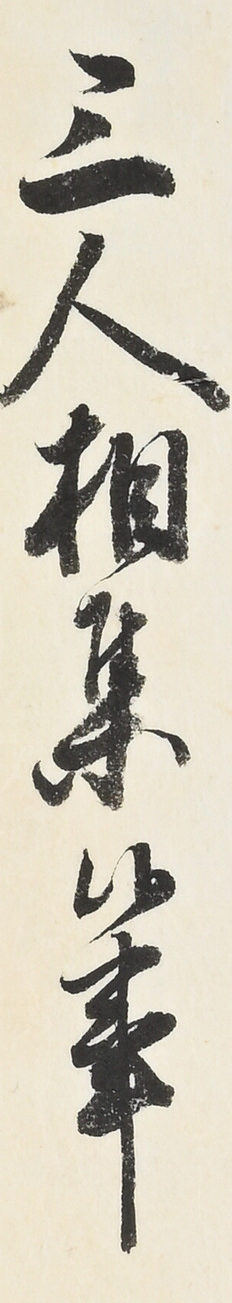三人相集候事
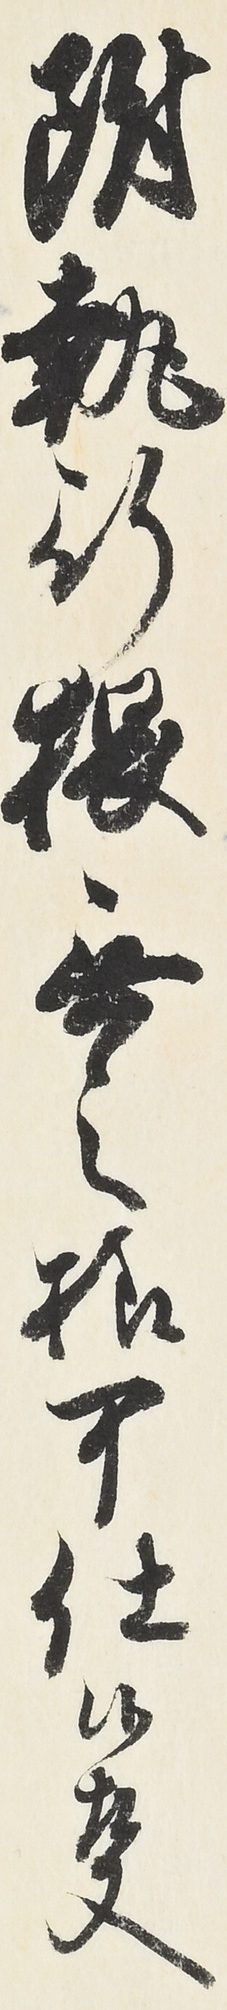附執行猥無之様可仕候事
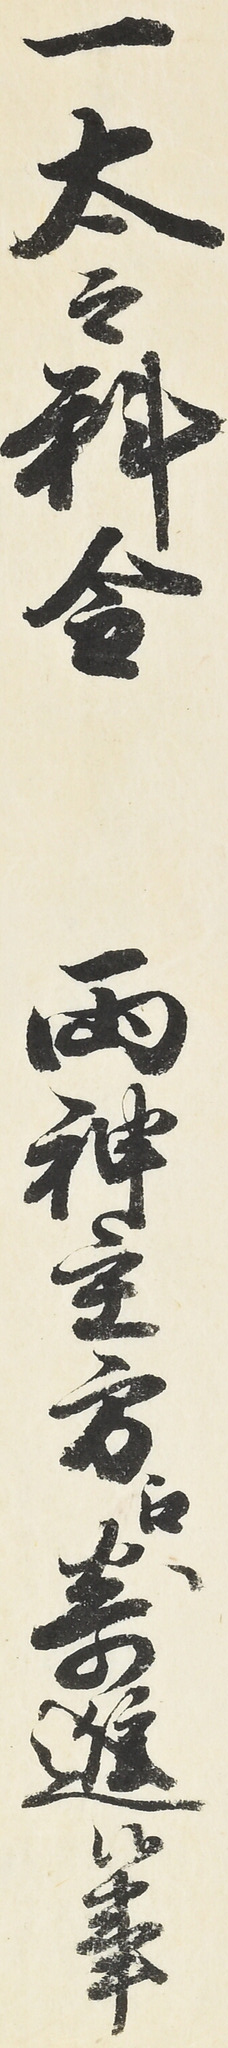一太々料金両神主方江寄進候事
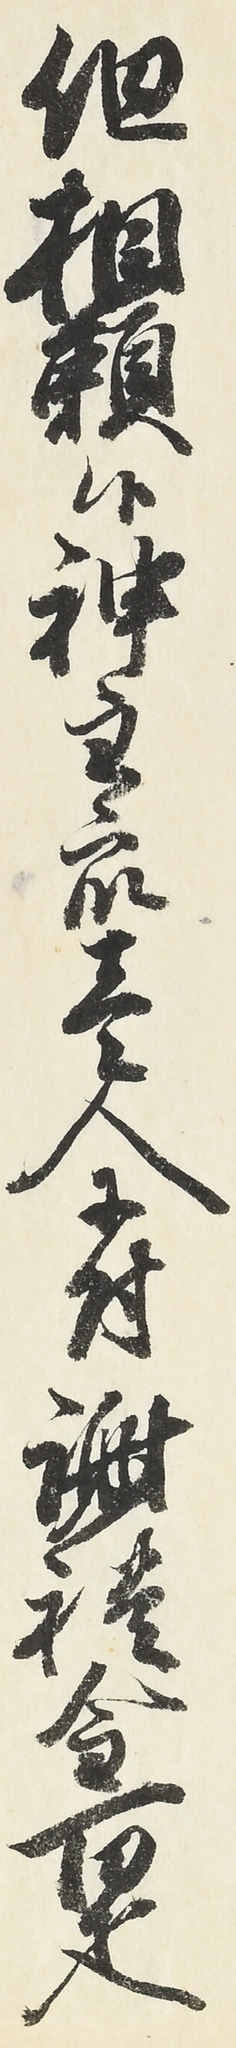但相頼候神主衆壱人に付謝礼金百疋
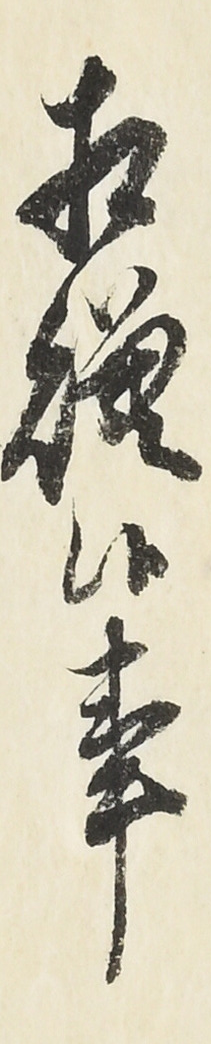相贈候事
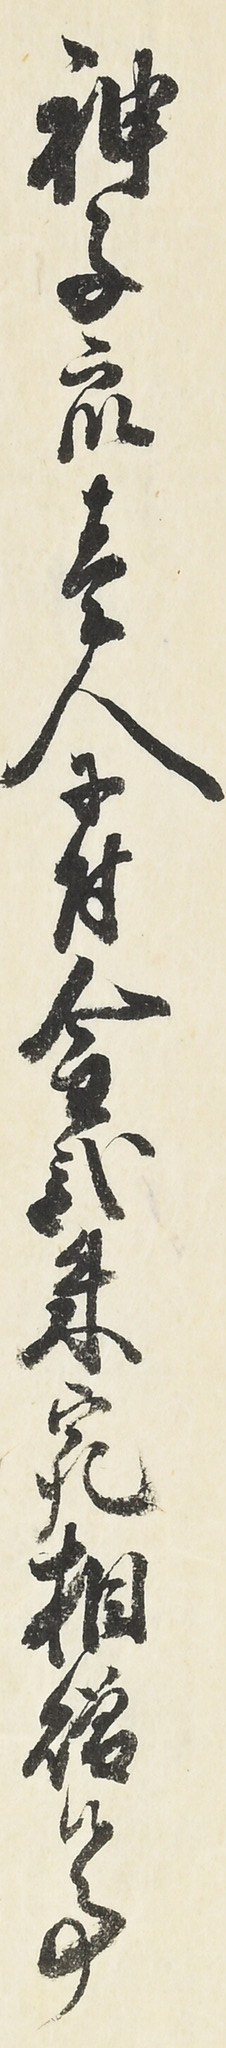神子衆壱人金弐朱宛相給候事
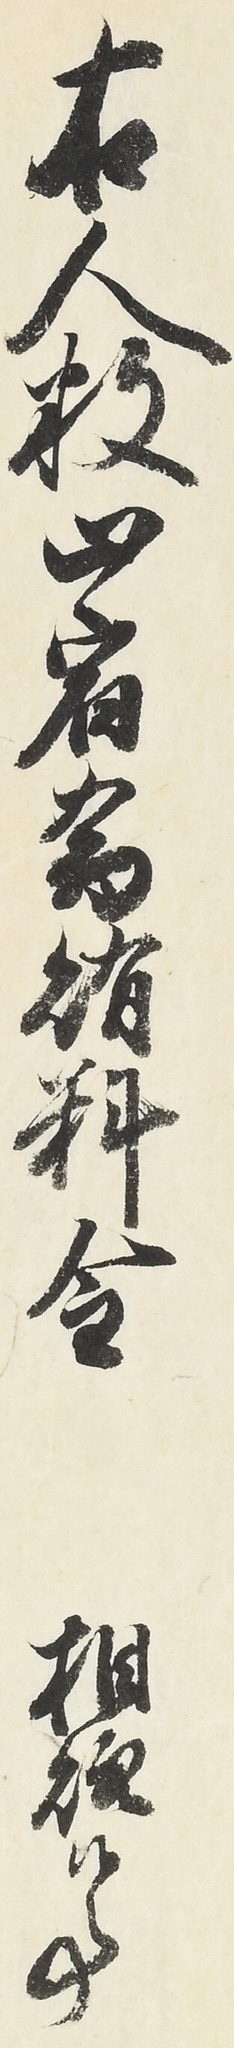右人数山宿為賄料金相贈候事
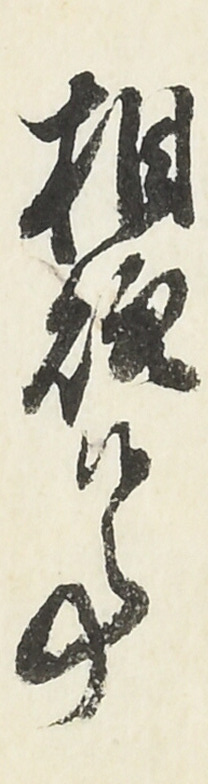相贈候事

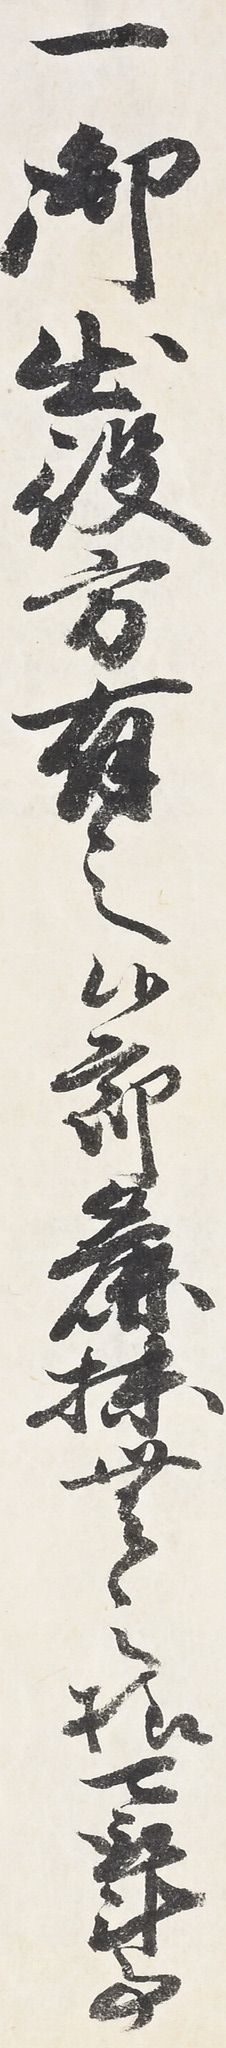一御出役方有之候節粗末無之様可被計事
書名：永代太々御神楽名前帳
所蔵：伊那市立高遠町図書館・合同会社AMANE
